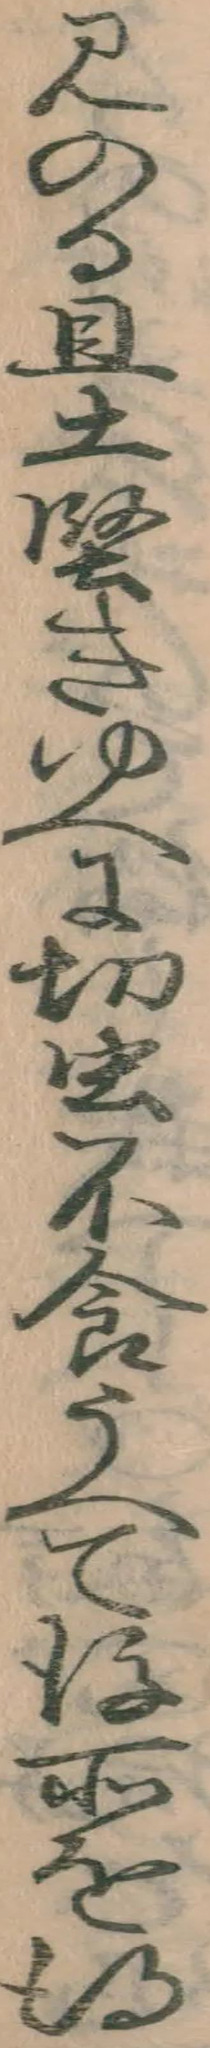みのる且土堅きゆへに切虫不食うへて後所を得
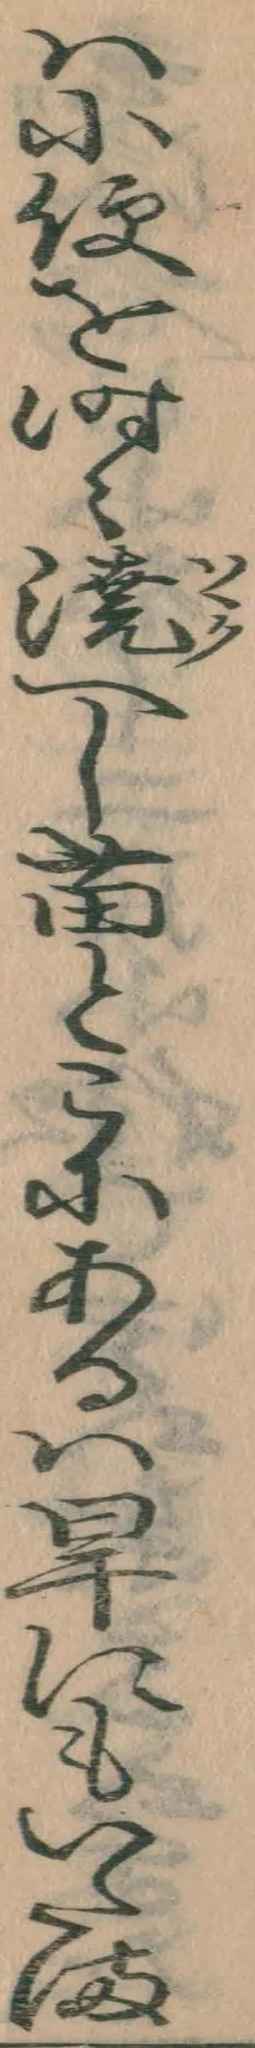は小便を時々澆へし苗とこにあるは旱にもいたま
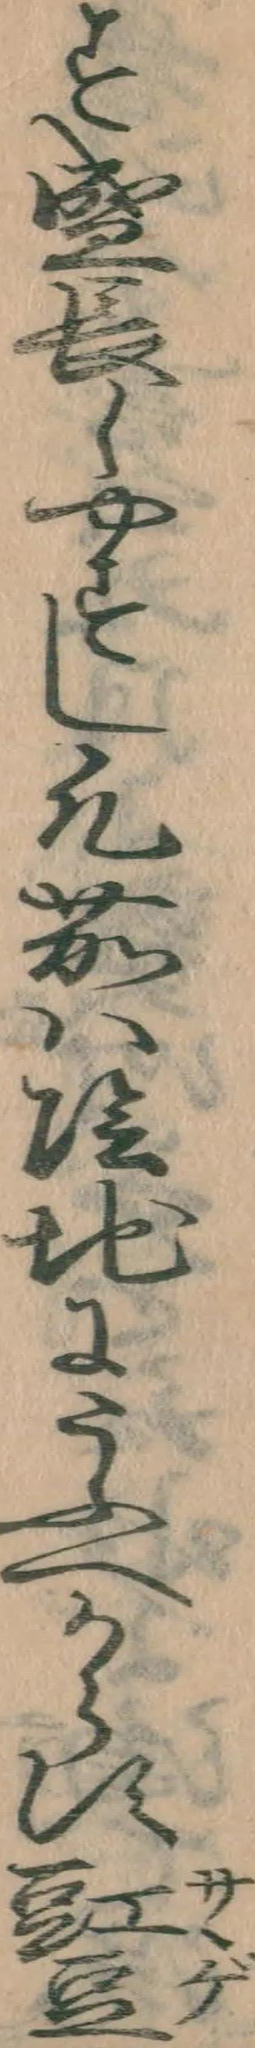す盛長しやすし凡茄は陰地にうふへからす豇豆
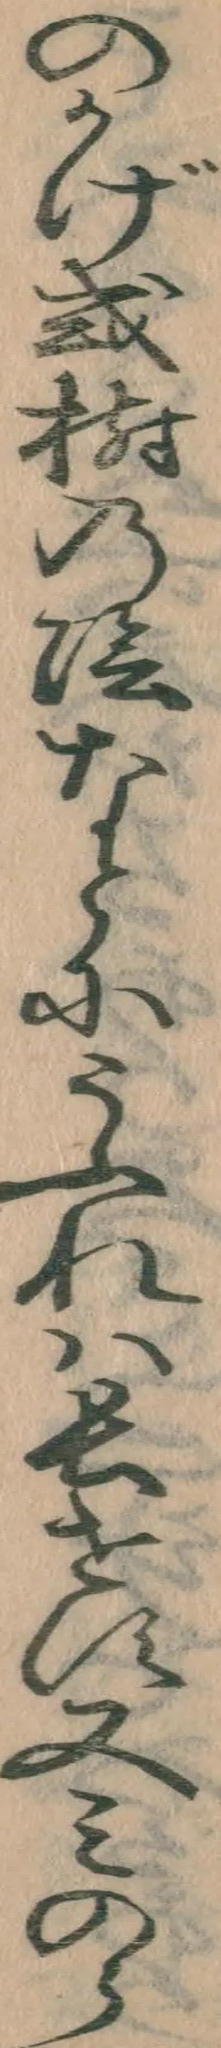のかげ或樹の陰なとにうふれは長せす又みのら
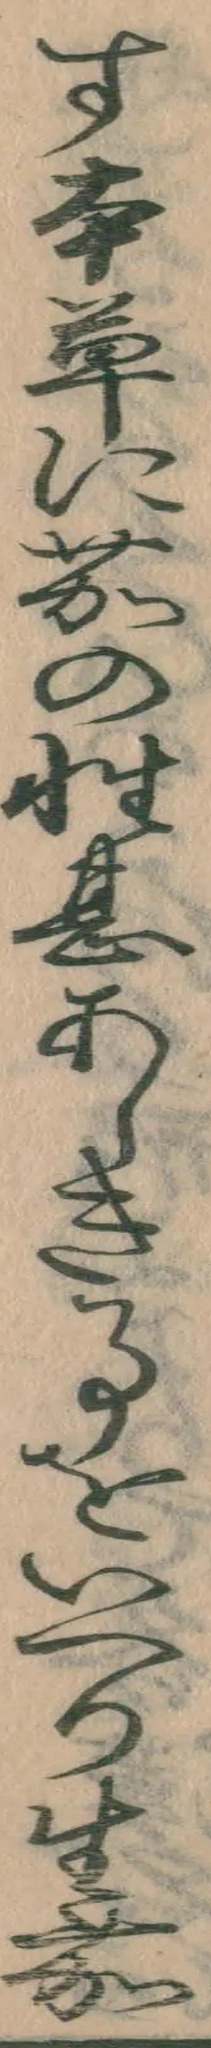す本草に茄の性甚あしき事をいへり生茄
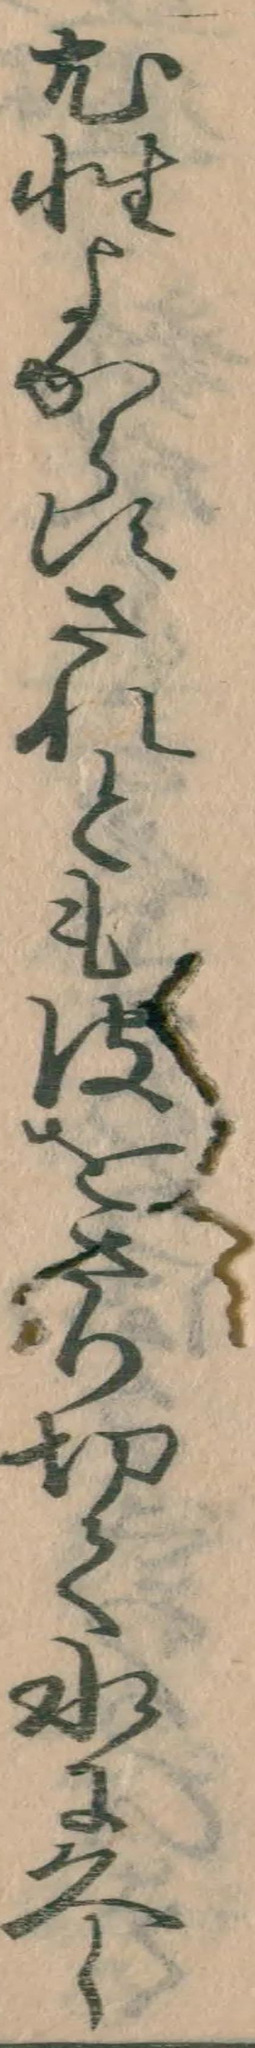尤性よからすされとも皮をさり切て水に久し
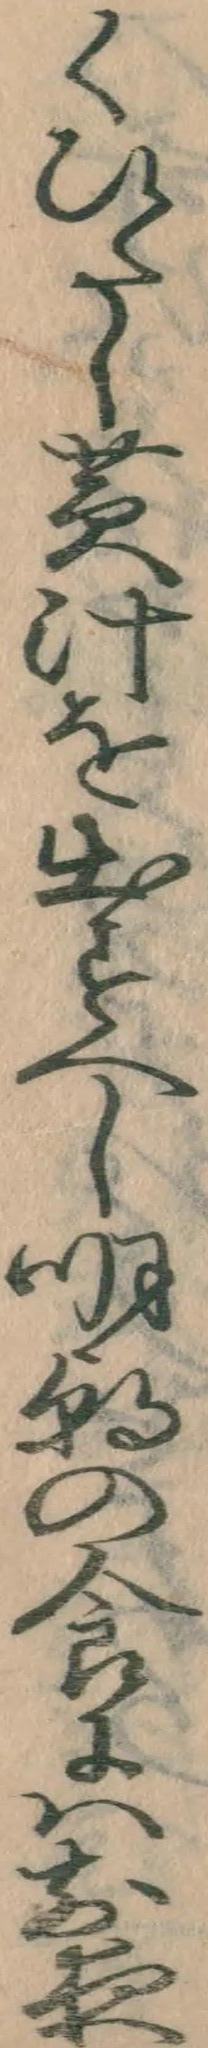くひたし黄汁を出すへし明朝の食には前夜
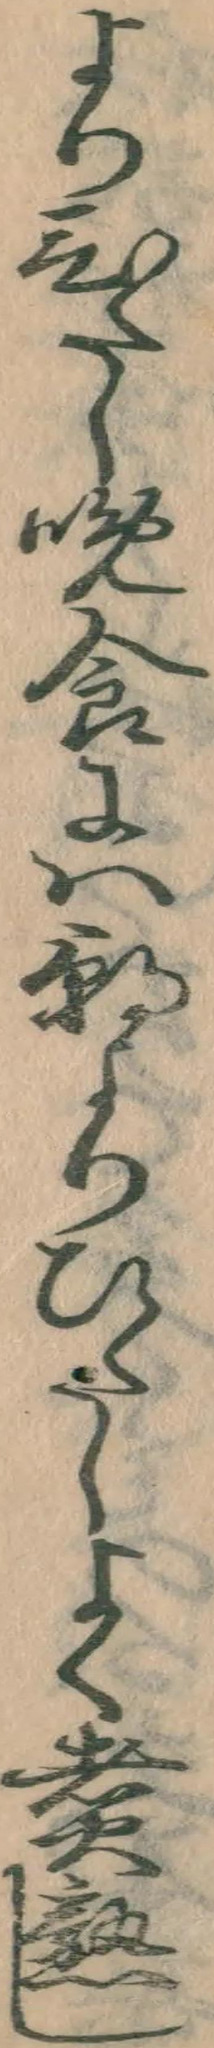よりひたし晩食には朝よりひたしよく煮熟し
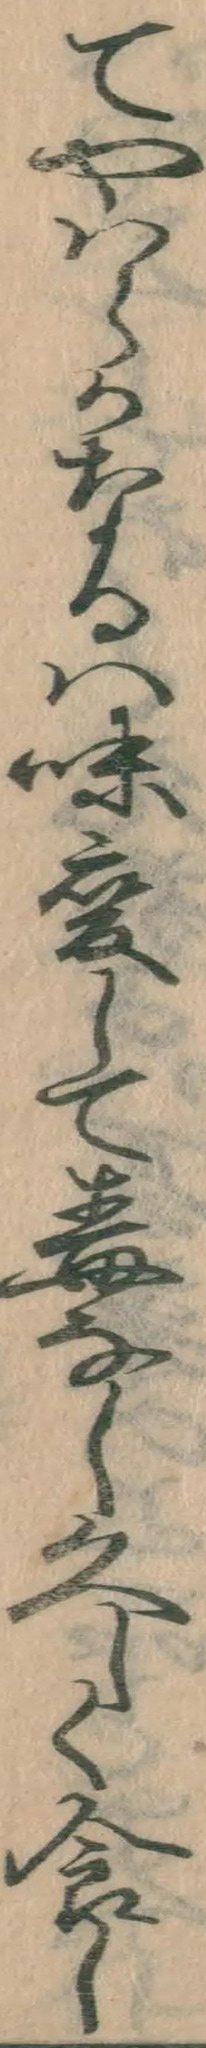てやはらかなるは味変して毒なし久しく食し
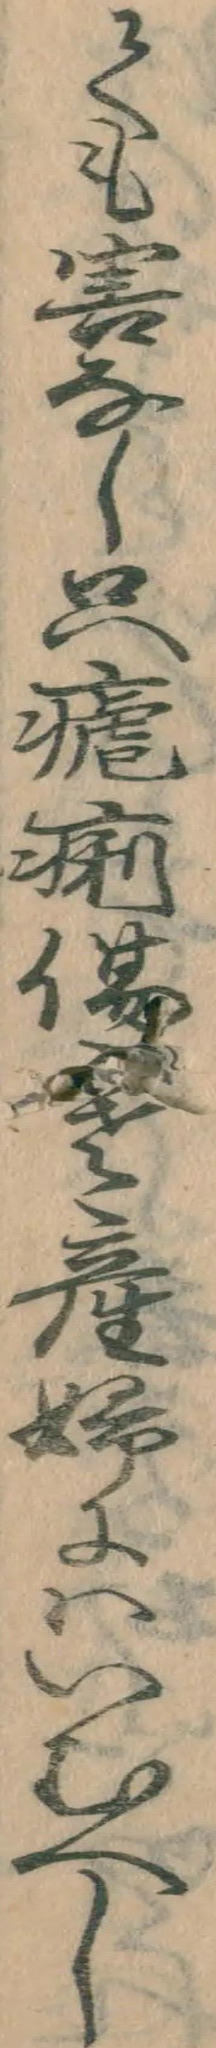ても害なし只瘧痢傷寒産婦にはいむへし

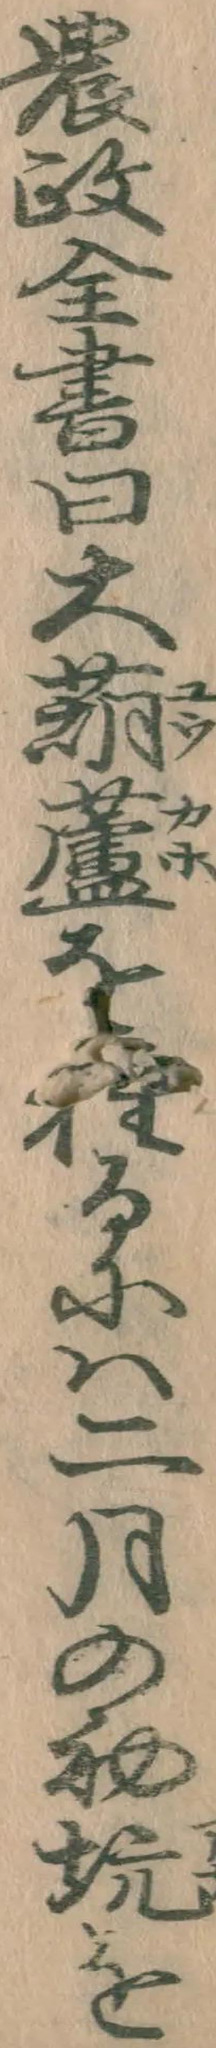農政全書曰大葫蘆を種るには二月のは初坑を
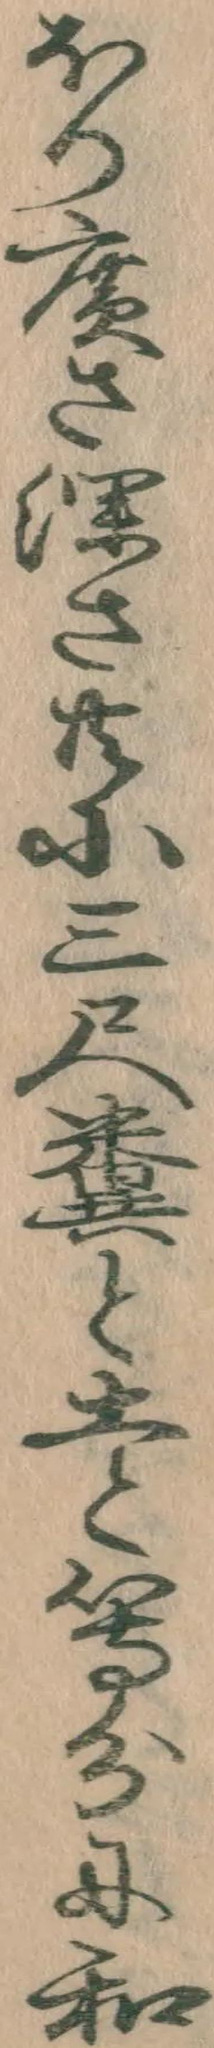ほり広さ深さ共に三尺糞と土と等分に和
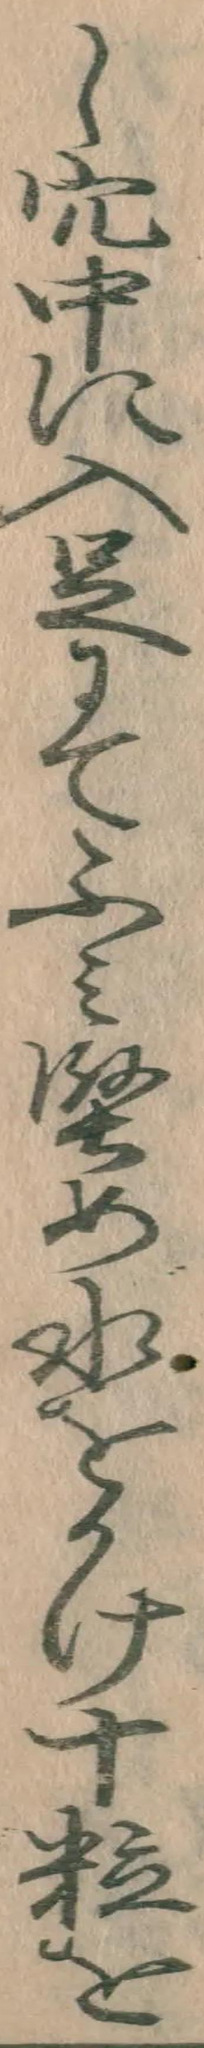し穴中に入足にてふみ堅め水をかけ十粒を
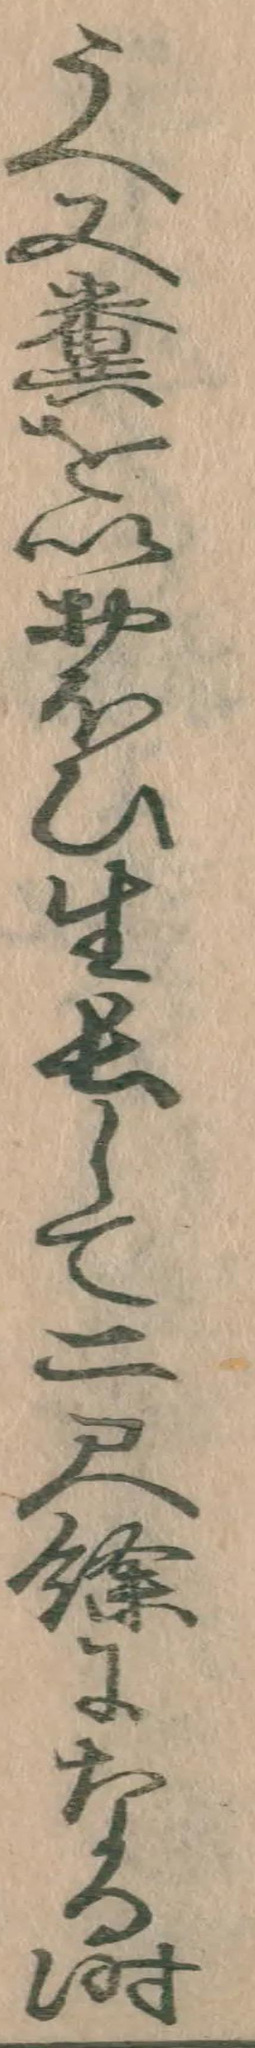うへ又糞を以おほひ生長して二尺余になる時
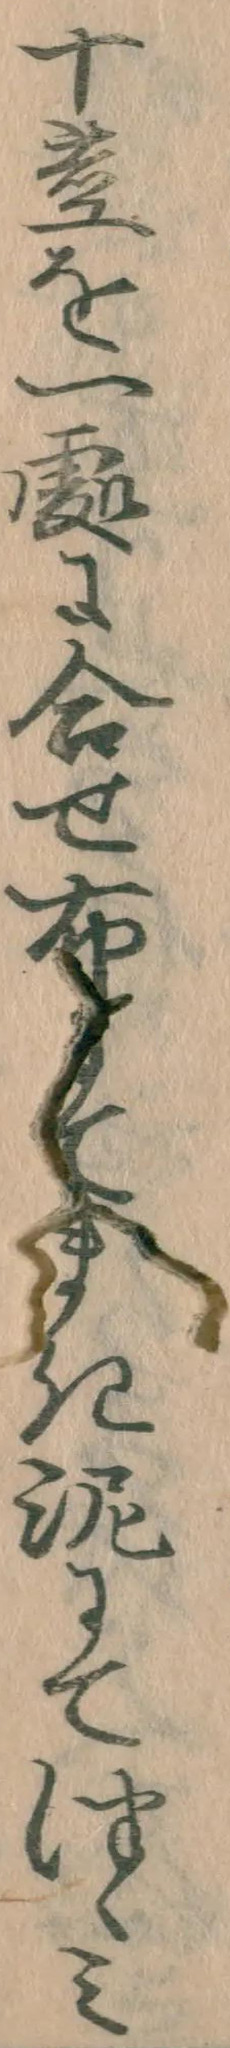十茎一処に合せ布にてまき泥にてつゝみ
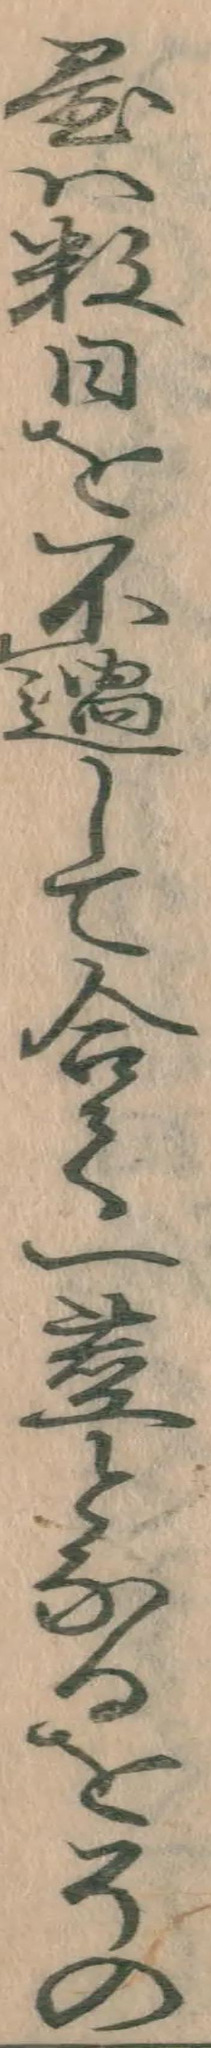置は数日を不過して剛合て一茎となるをその
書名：菜譜 3巻
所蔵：国立国会図書館 National Diet Library, JAPAN
